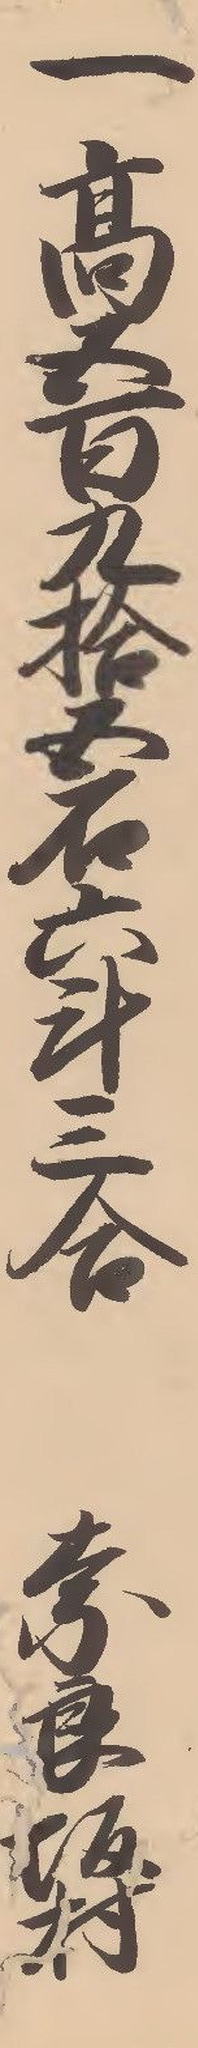一高五百九拾五石六斗三合奈良坂村
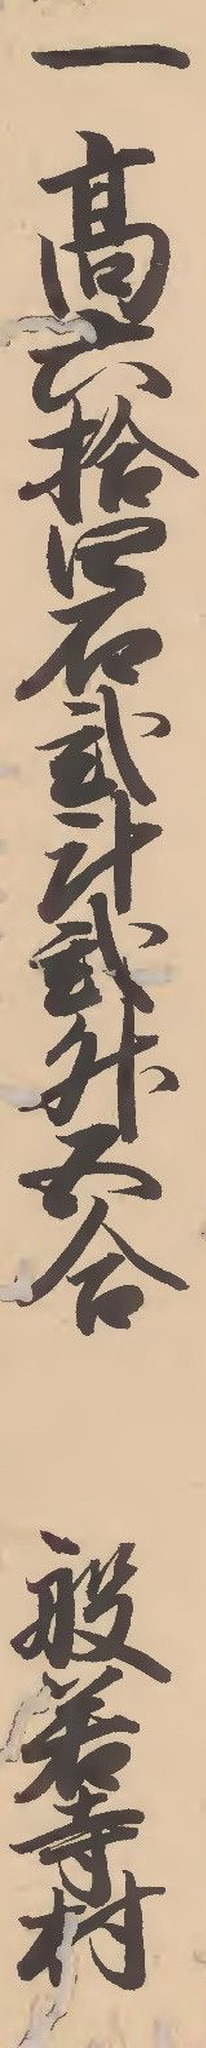一高六拾四石弐斗弐升五合般若寺村

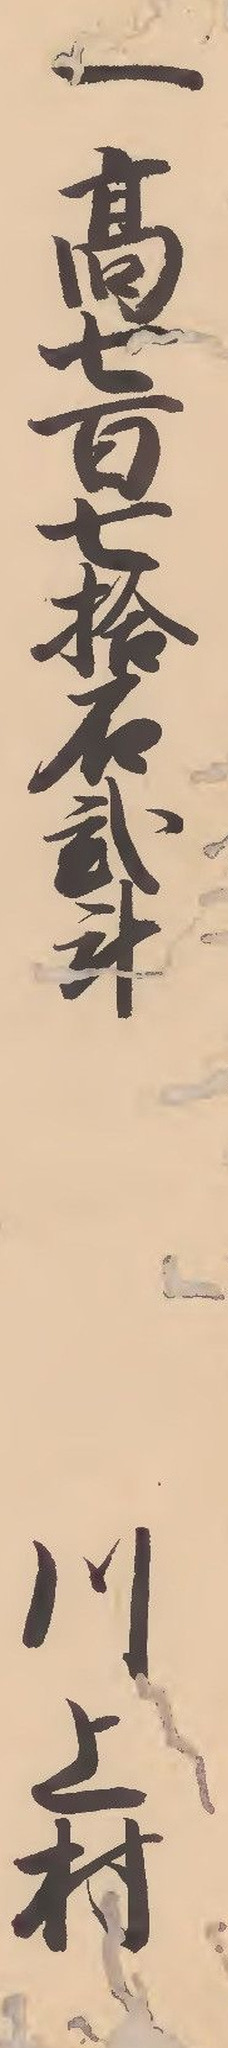一高七百七拾石弐斗川上村
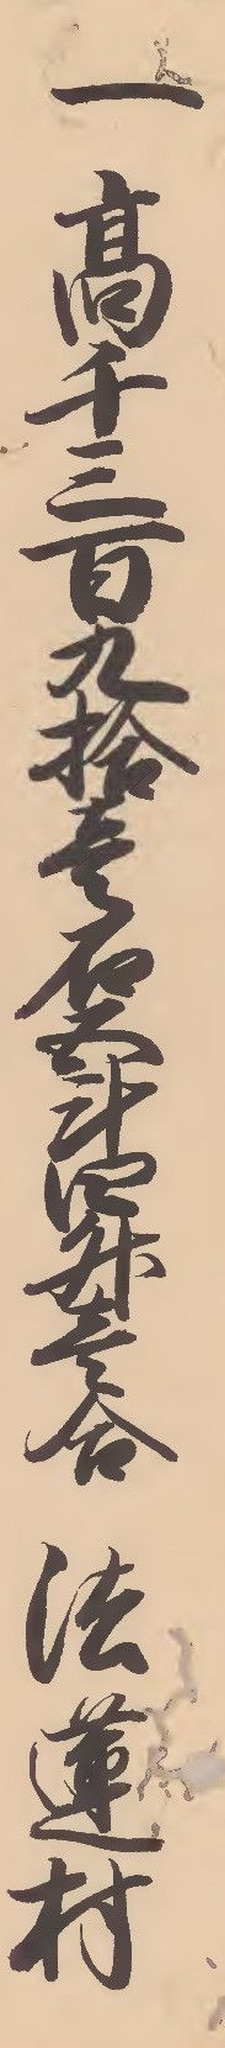一高千三百九拾壱石五斗四升壱合法蓮村
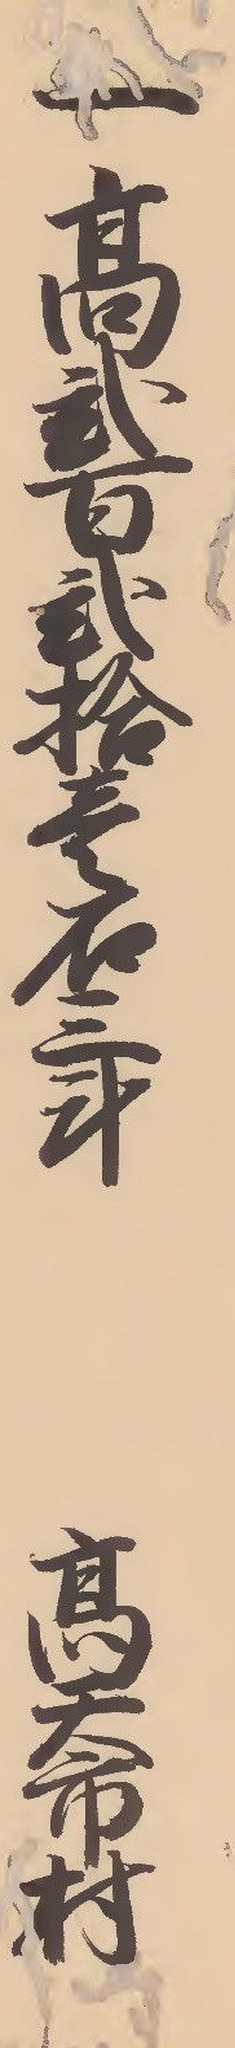一高弐百弐拾壱石三斗高天市村
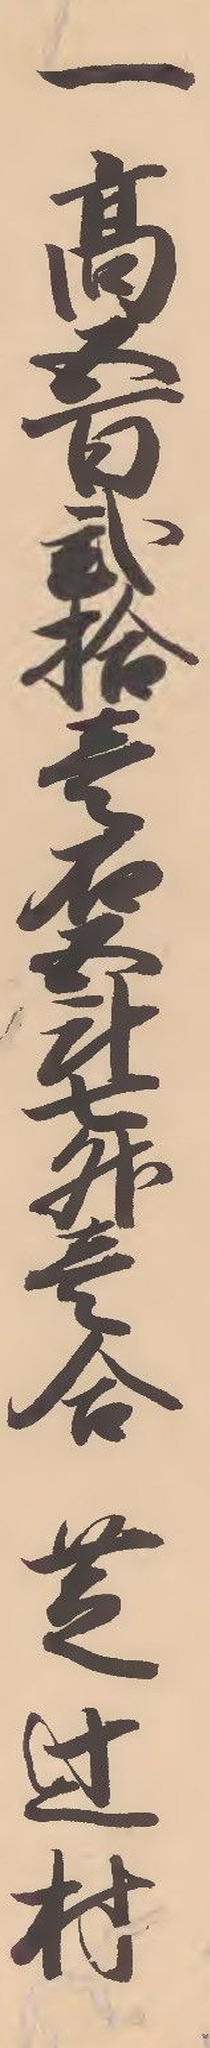一高五百弐拾壱石五斗七升壱合芝辻村
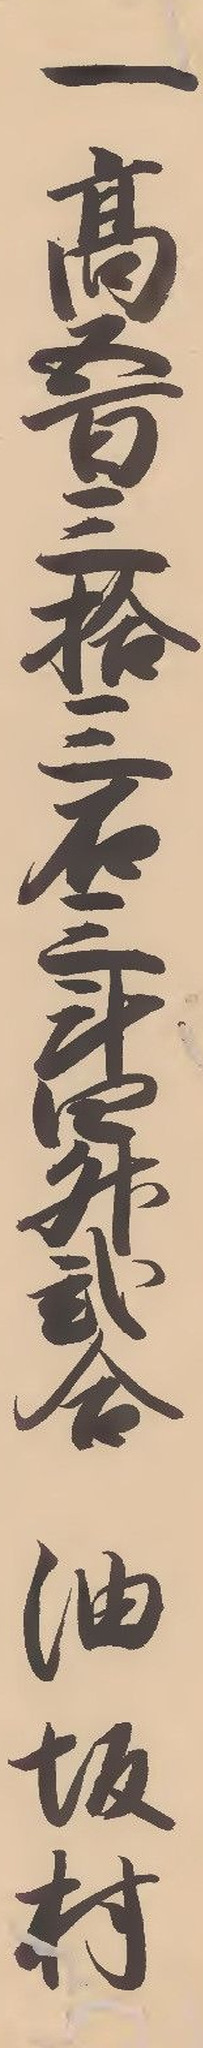一高五百三拾三石三斗四升弐合油坂村
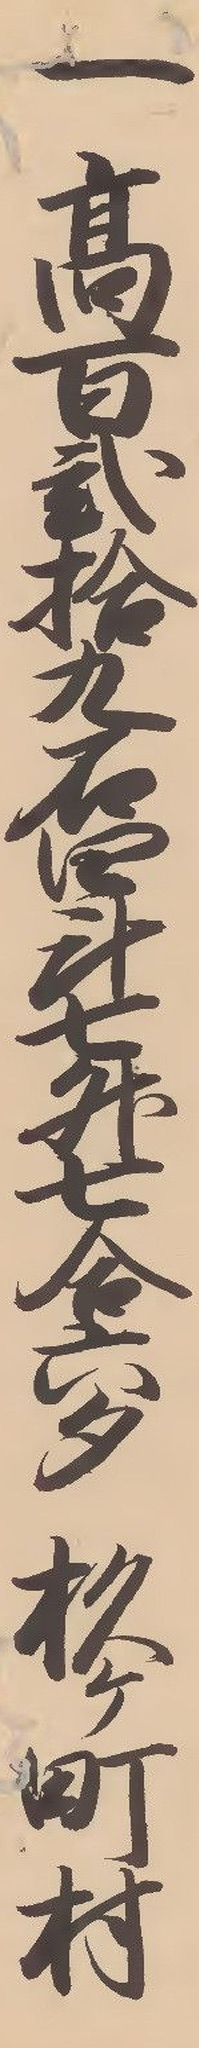一高百弐拾九石四斗七升七合六勺杉ヶ町村
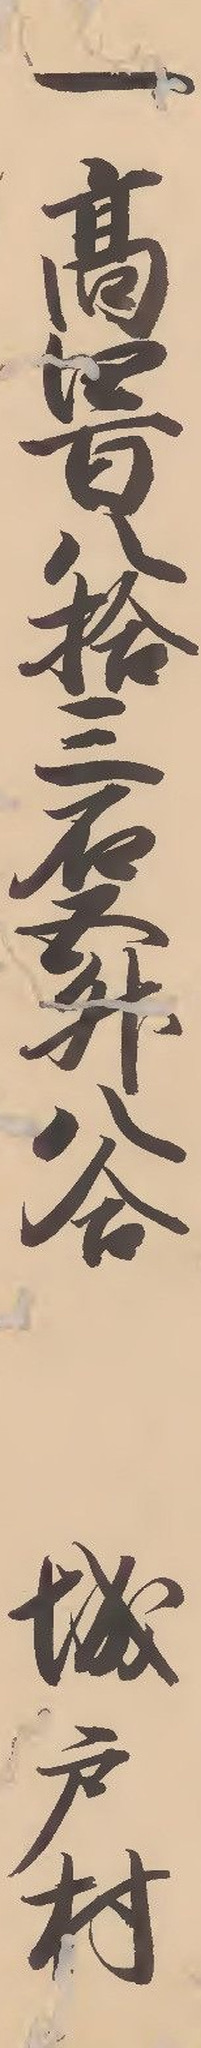一高四百八拾三石五升八合城戸村

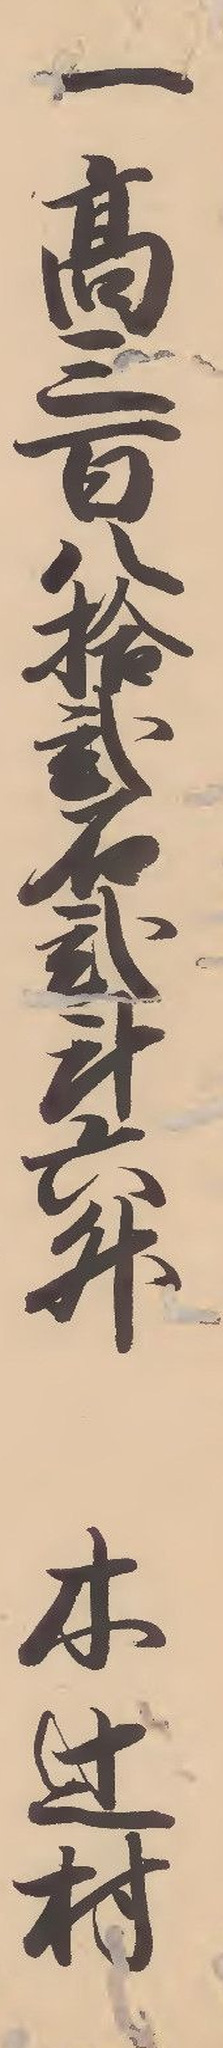一高三百八拾弐石弐斗六升木辻村
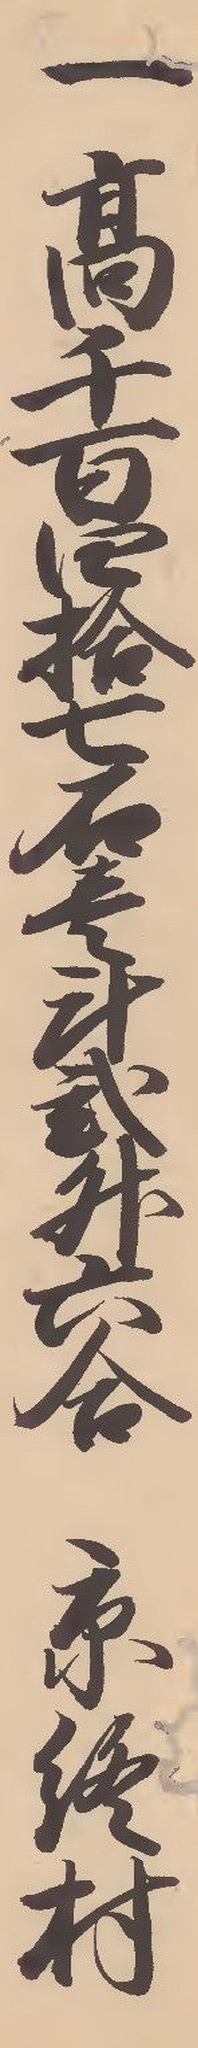一高千百四拾七石壱斗弐升六合京終村
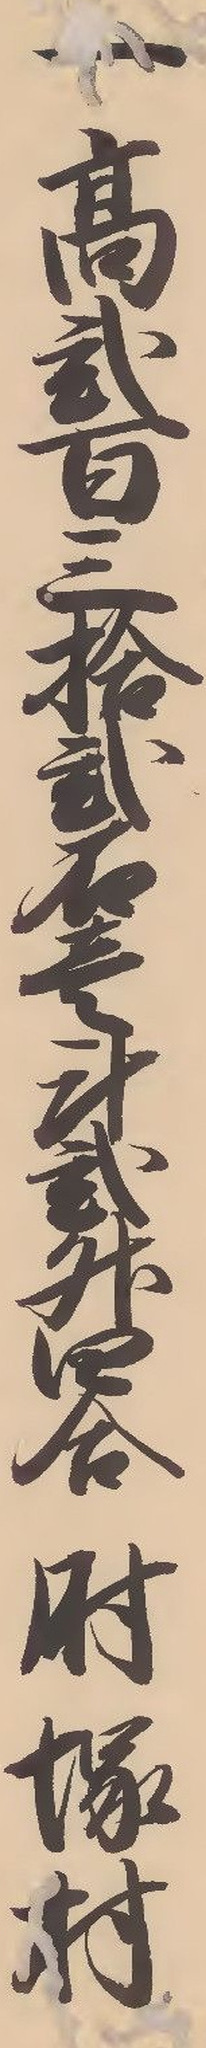一高弐百三拾弐石壱斗弐升四合肘塚村
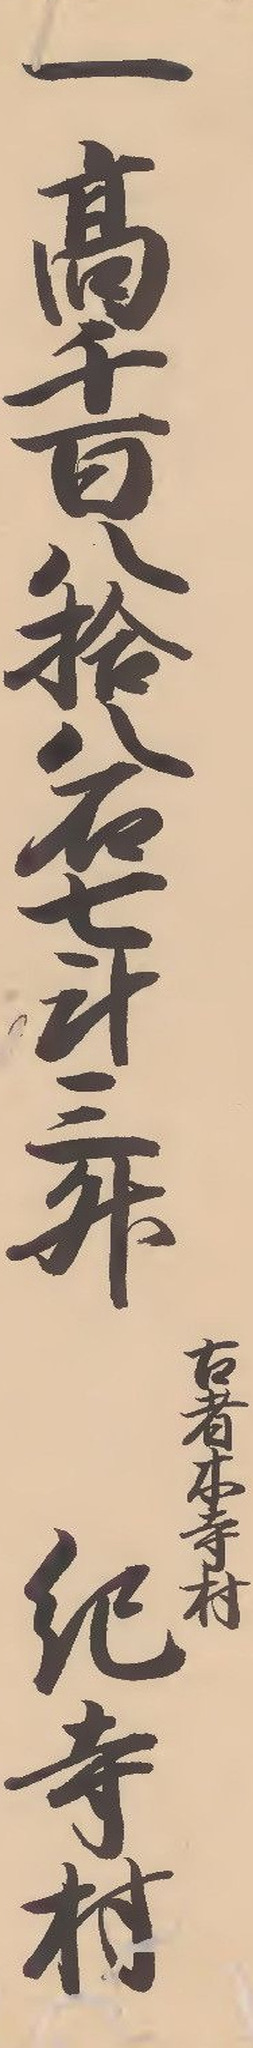一高千百八拾八石七斗三升紀寺村
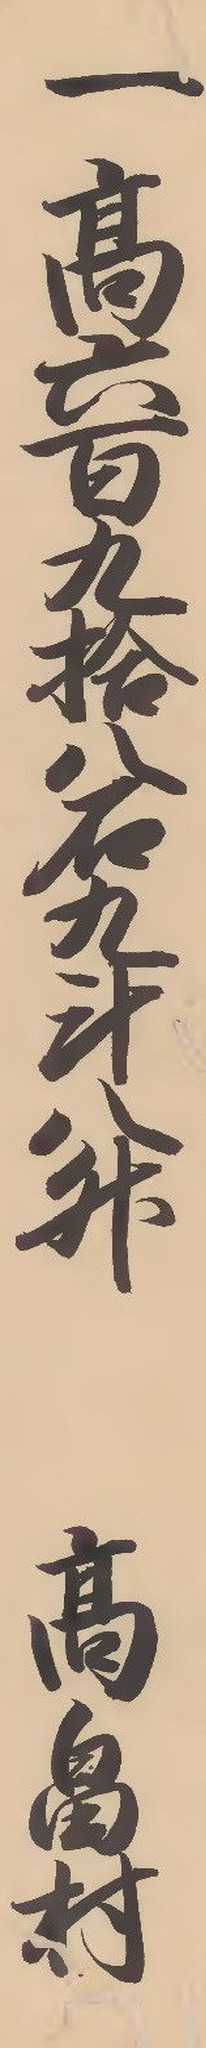一高六百九拾八石九斗八升高畠村
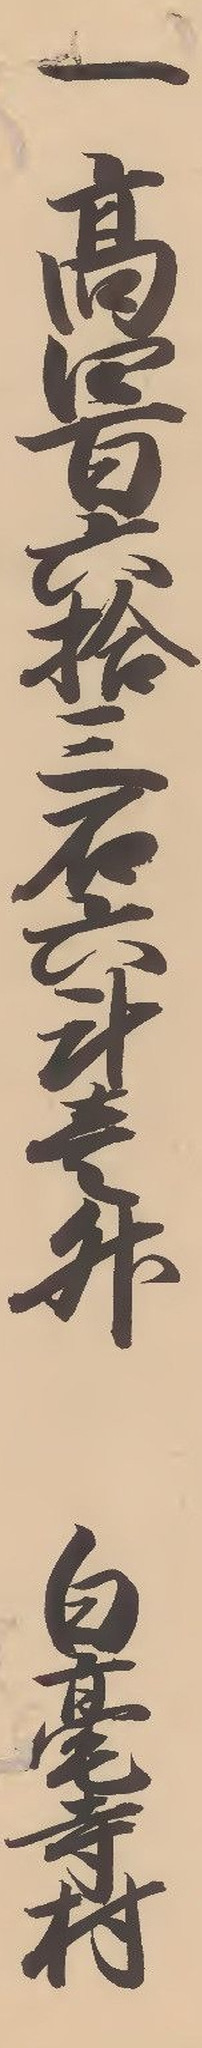一高四百六拾三石六斗壱升白毫寺村
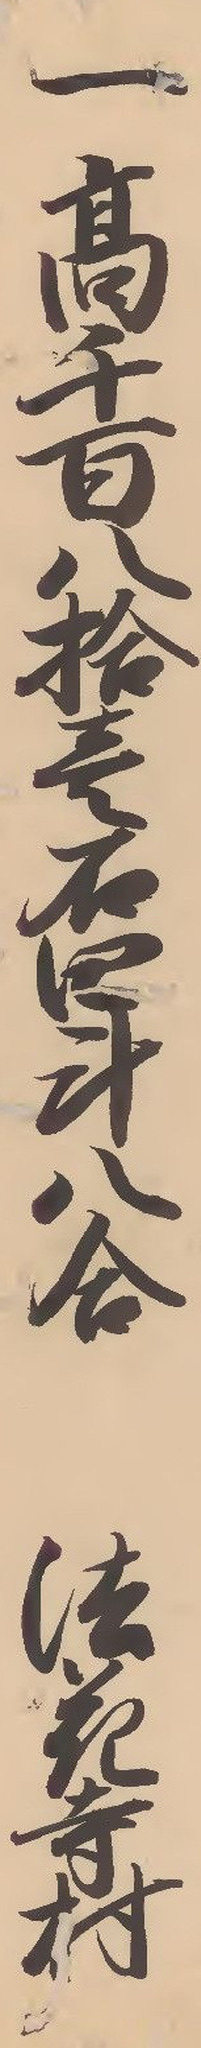一高千百八拾壱石四斗八合法花寺村
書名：大和国郷帳
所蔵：国立公文書館 National Archives of Japan
